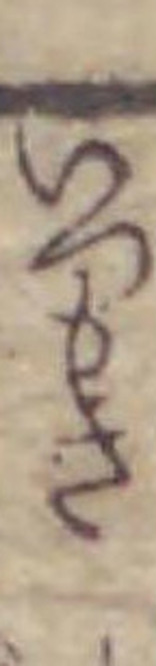いつもき
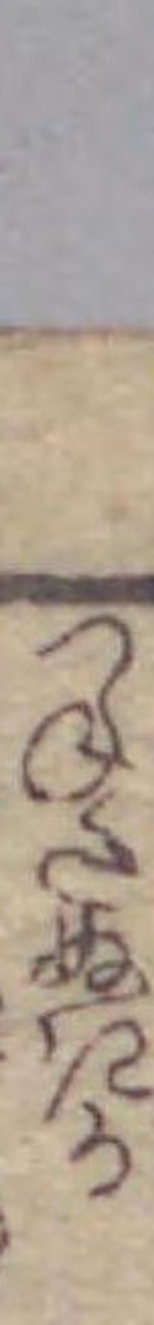つねたぬきが
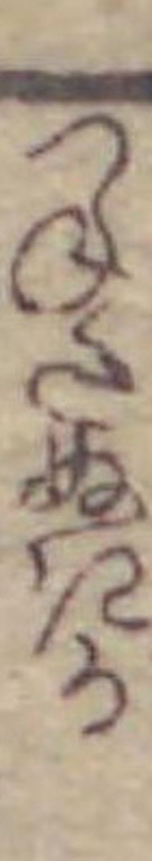つねたぬきが
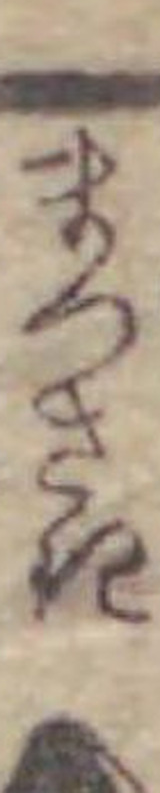まつさき
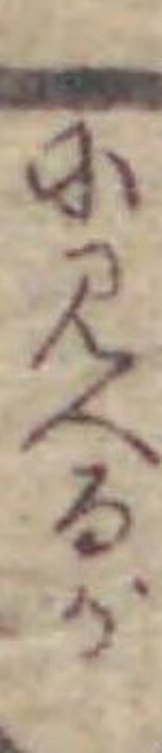に見へるが
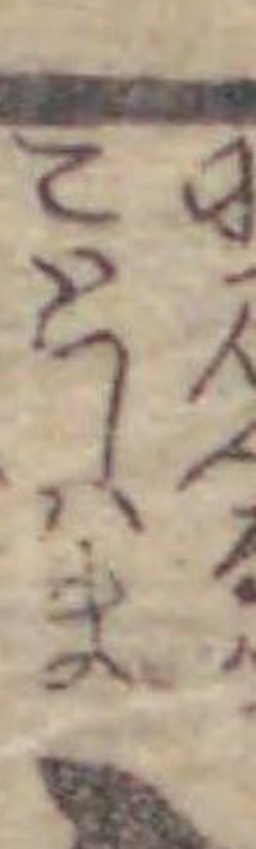ことしはま
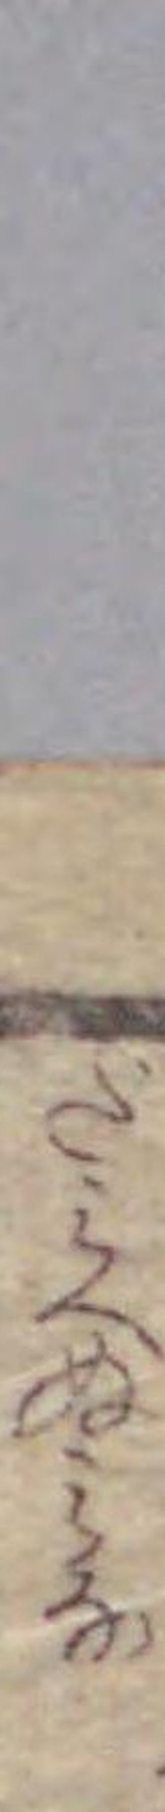だみへぬみな
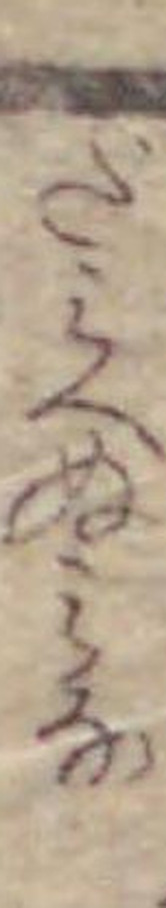だみへぬみな
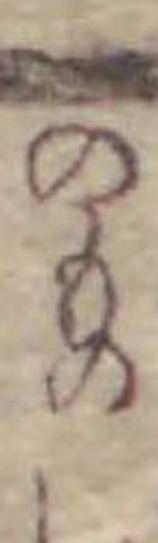のもの
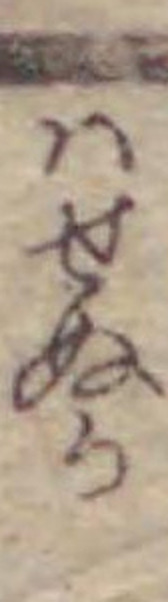はせぬか

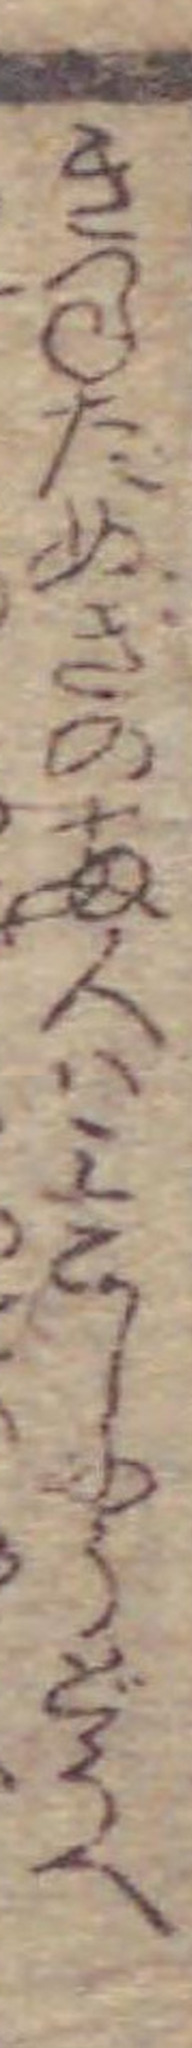きつねたぬきの両人はみこしにうどうへ
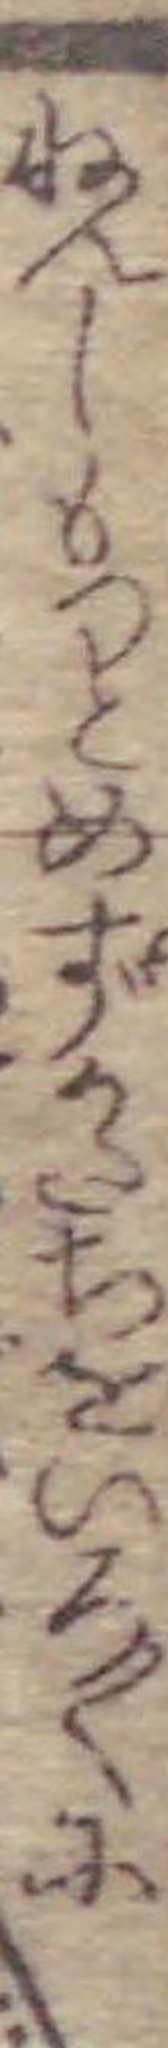ねんしもつとめずかたちをいろ〳〵に
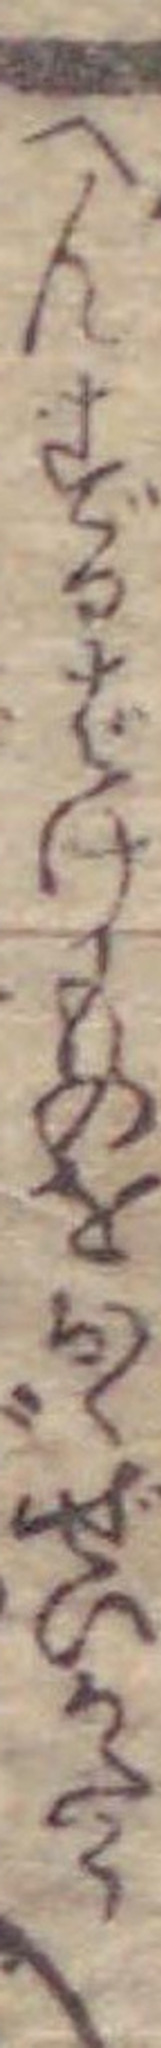へんずるばけものをおゝぜいかたら
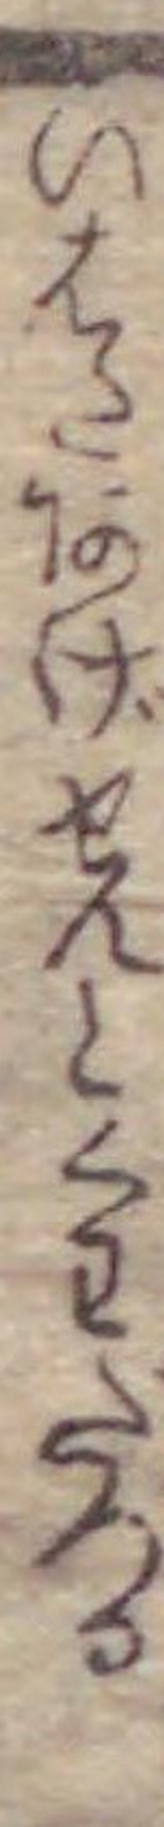いはたあげせんとくわだつる
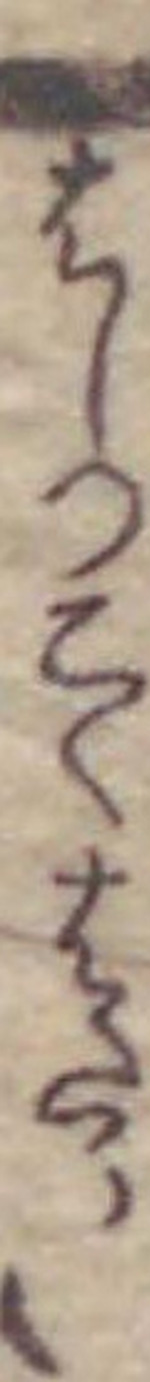はしつこくはたら
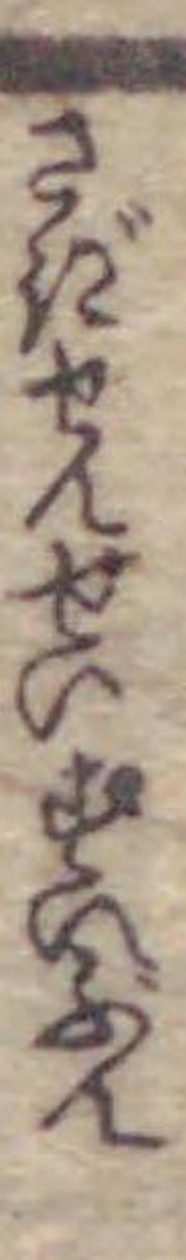さぎせんせいずいぶん
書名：化物仲間破 : 2巻
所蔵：国立国会図書館 National Diet Library, JAPAN
